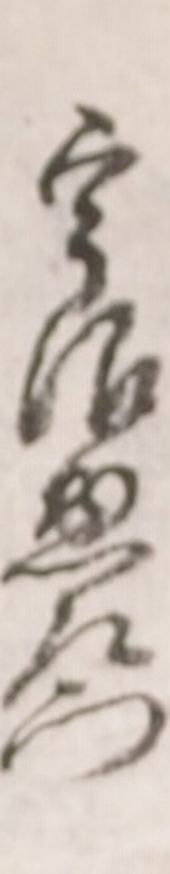宇治惣左衛門
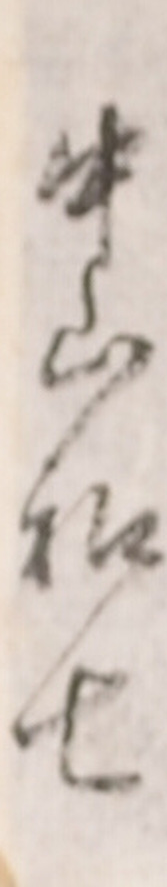中山和七
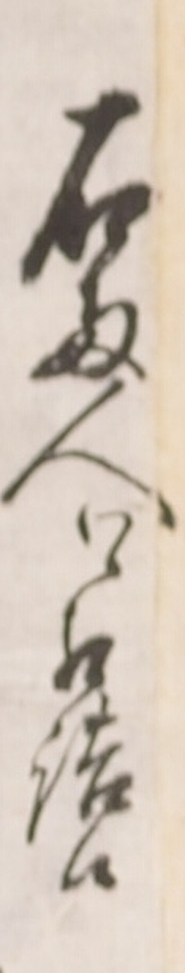右両人ツヽ相詰候
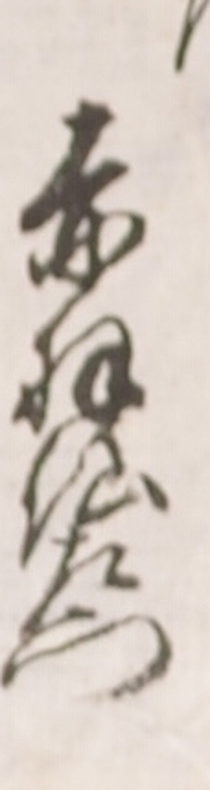赤羽仙左衛門
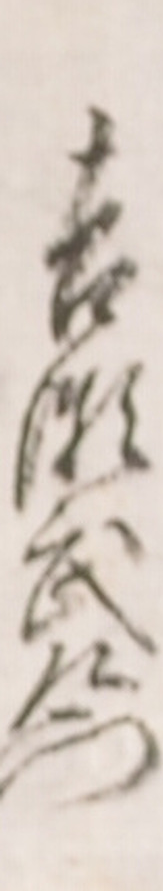吉瀬武左衛門
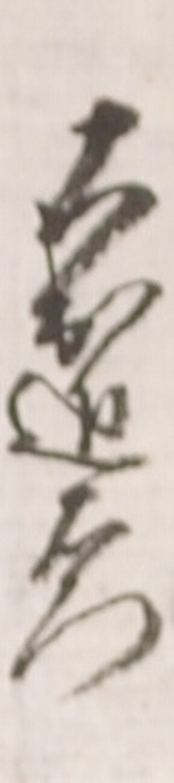大出近右衛門
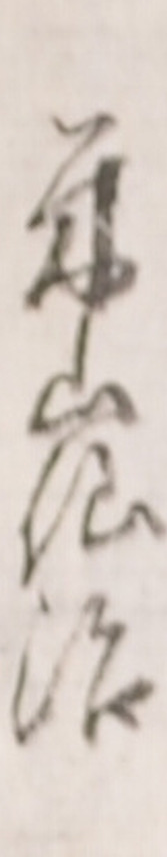米山仙治
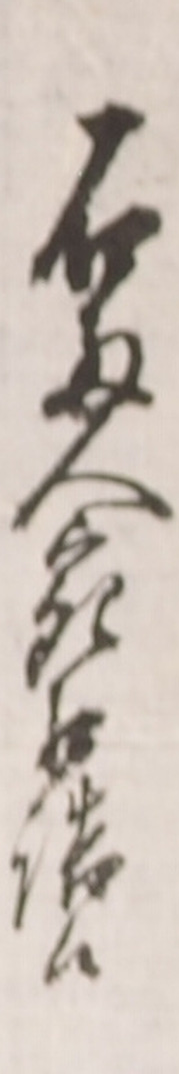右両人宛相詰候
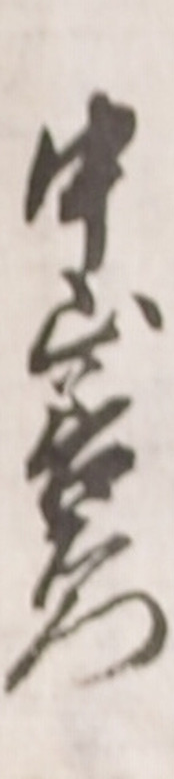中山善右衛門
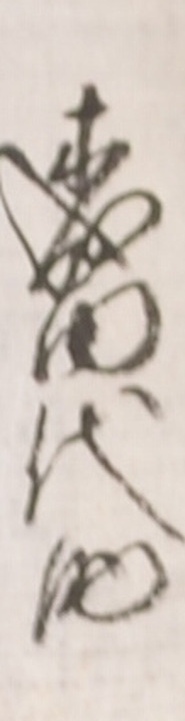森田代助
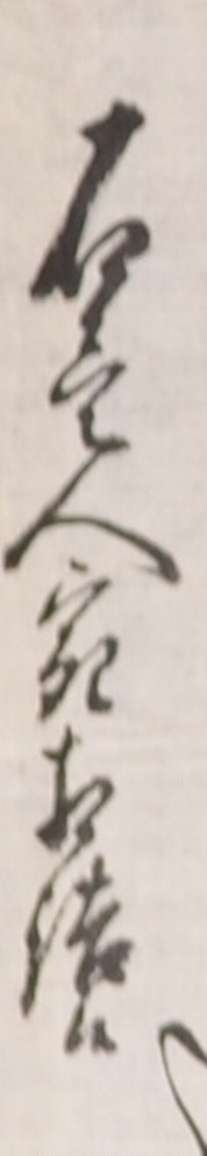右壱人宛相詰候
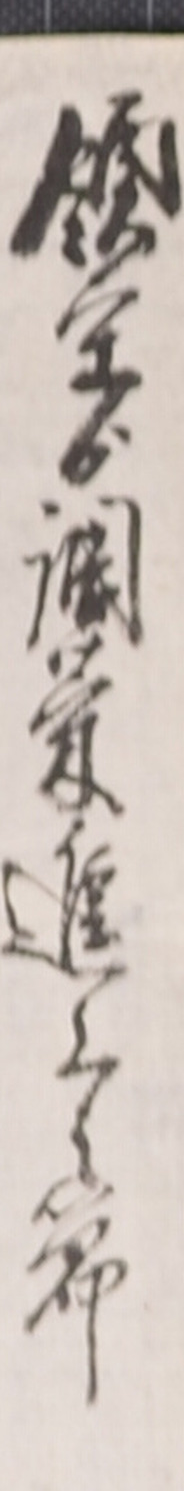領主ゟ調栄進上之節
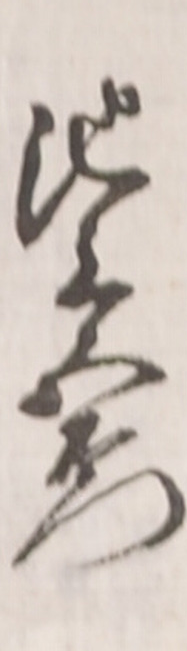池上五右衛門
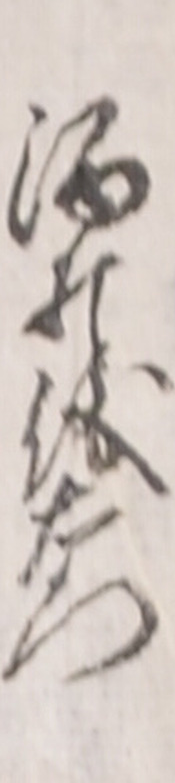酒井儀右衛門
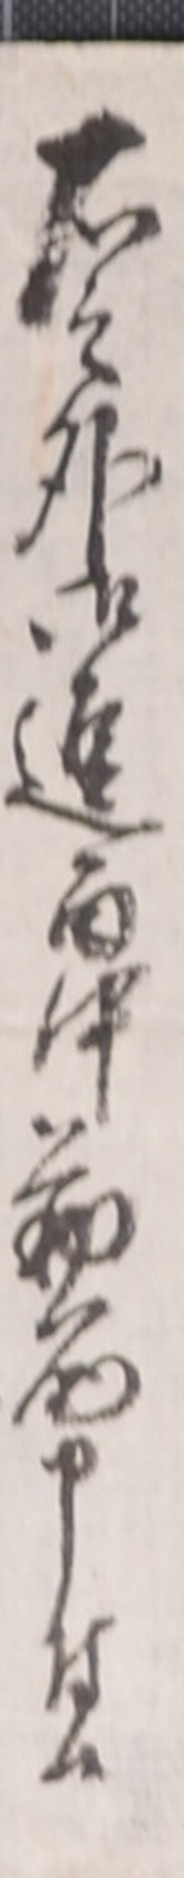右之外御逗留中勤筋申付候
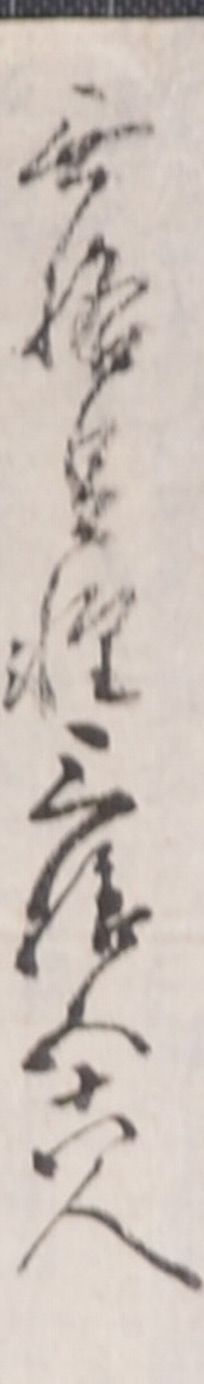無格足軽三拾五六人
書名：（覚）
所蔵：伊那市立高遠町図書館・合同会社AMANE
